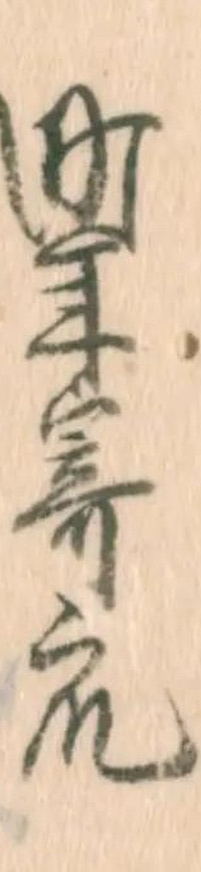町年寄衆
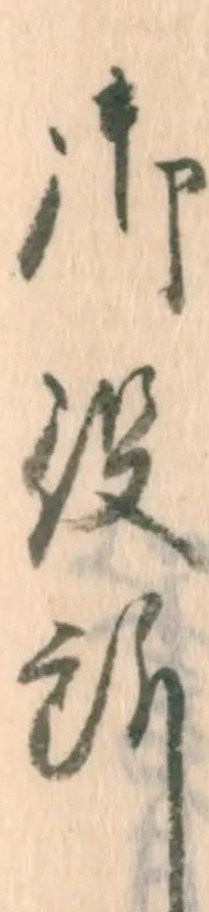御役所
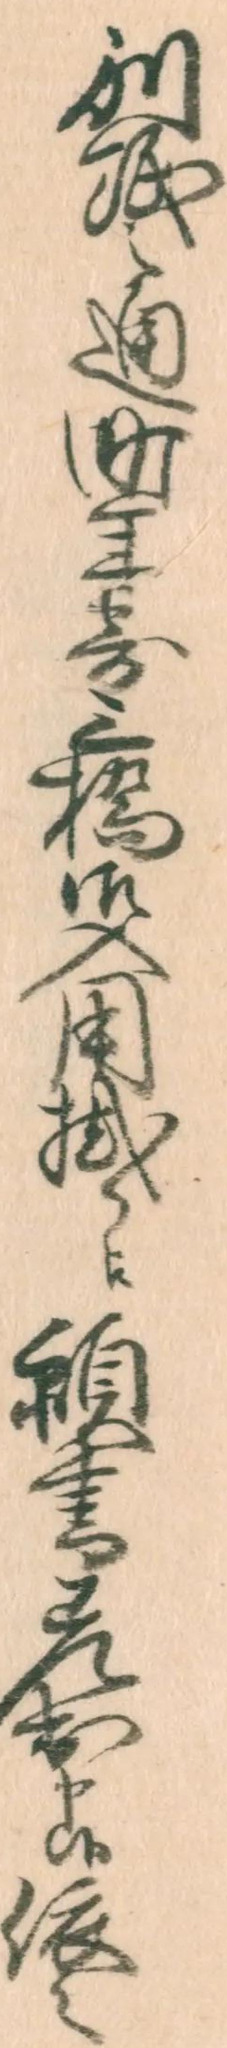別紙之通町年寄三橋御入用掛リえ願書差出申候依之
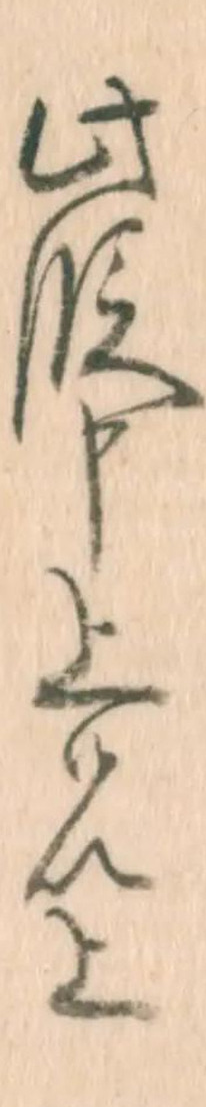此段申上候以上
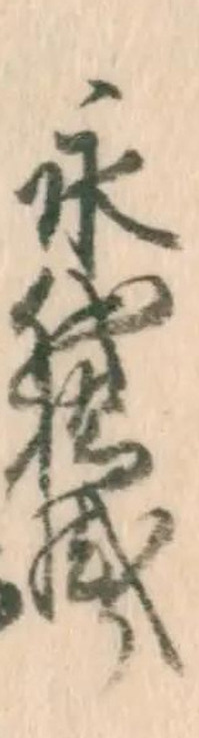永代橋掛リ

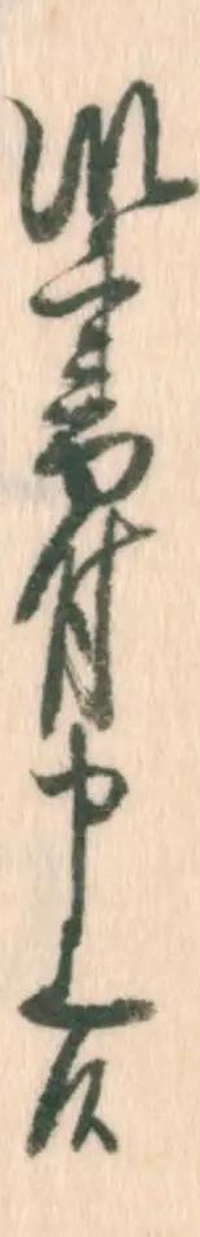以書付申上候
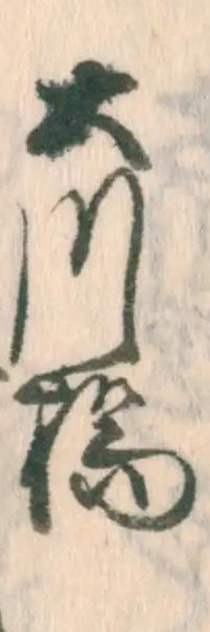大川橋
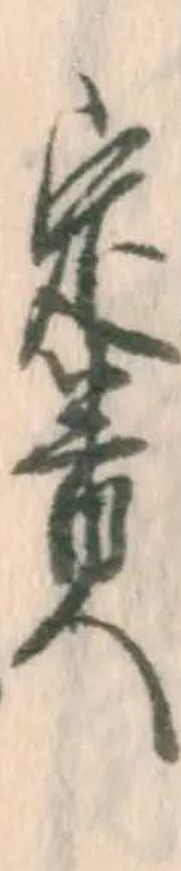定番人
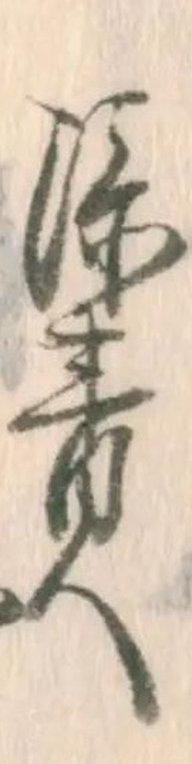添番人
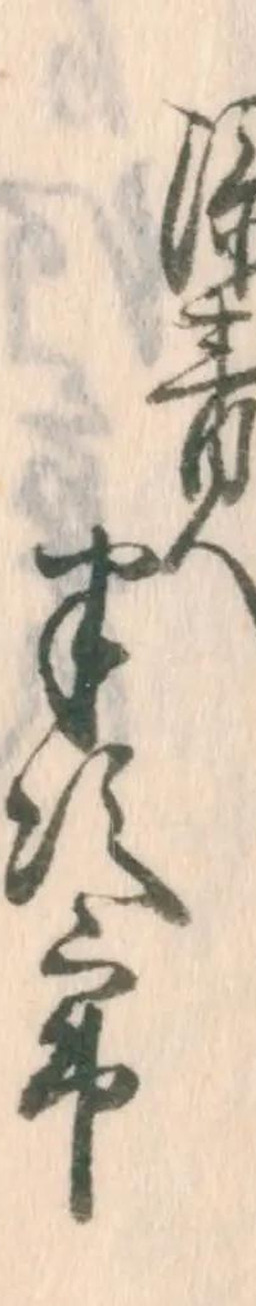半次郎
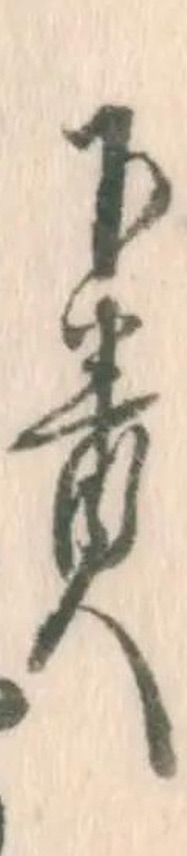下番人
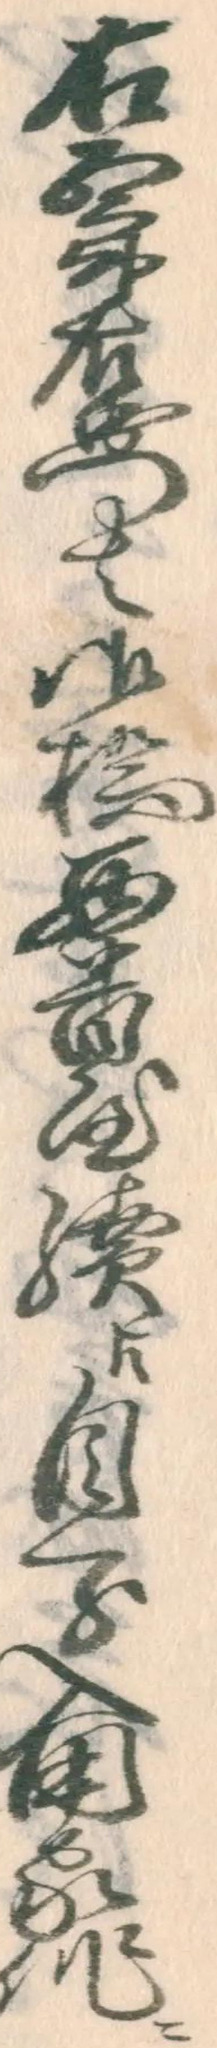右五郎右衛門は御橋西番屋続え自分入用家作ニ
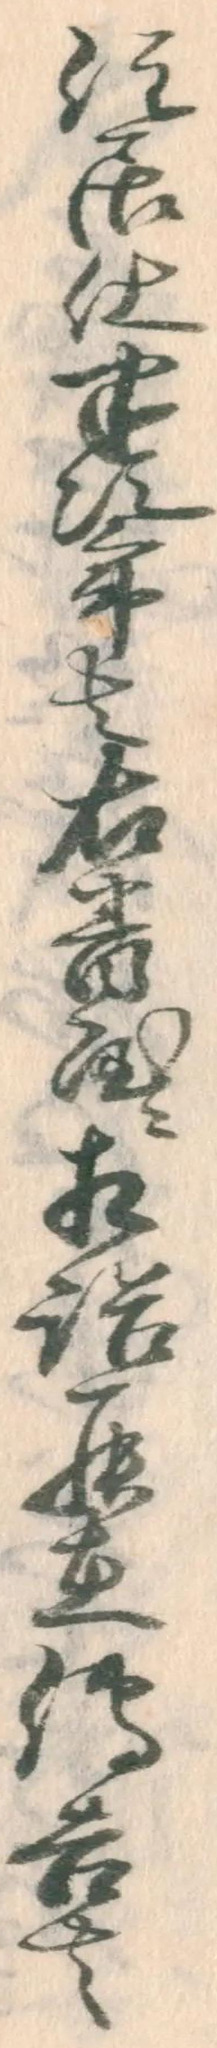住居仕半次郎は右番屋ニ相詰罷在伝吉は
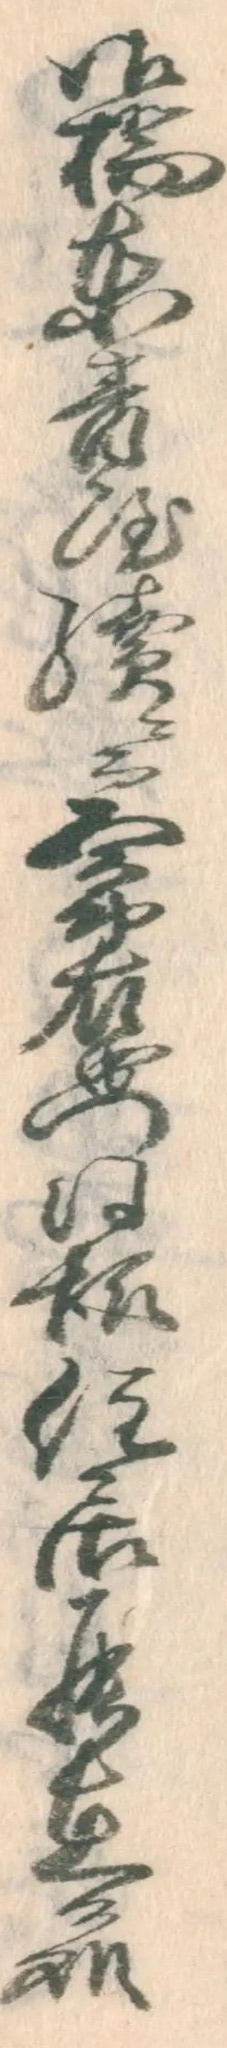御橋東番屋続ニ而五郎右衛門同様住居罷在候処

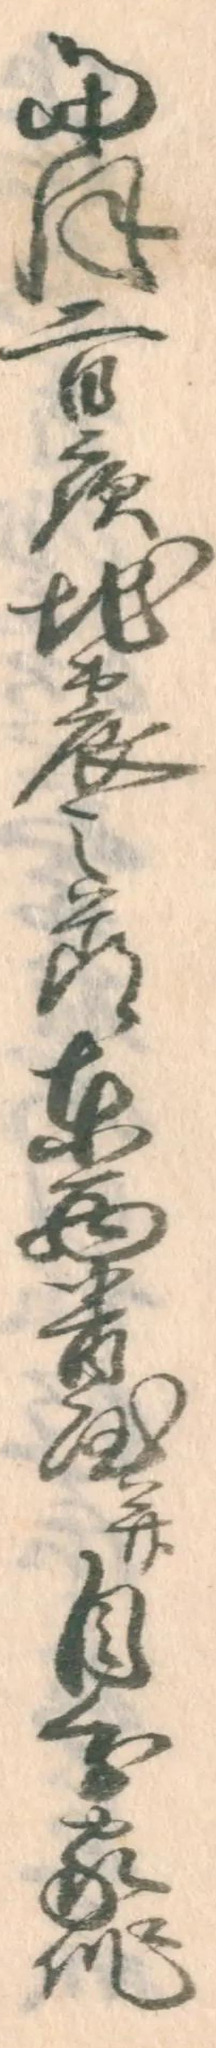当月二日夜地震之節東西番屋并自分家作
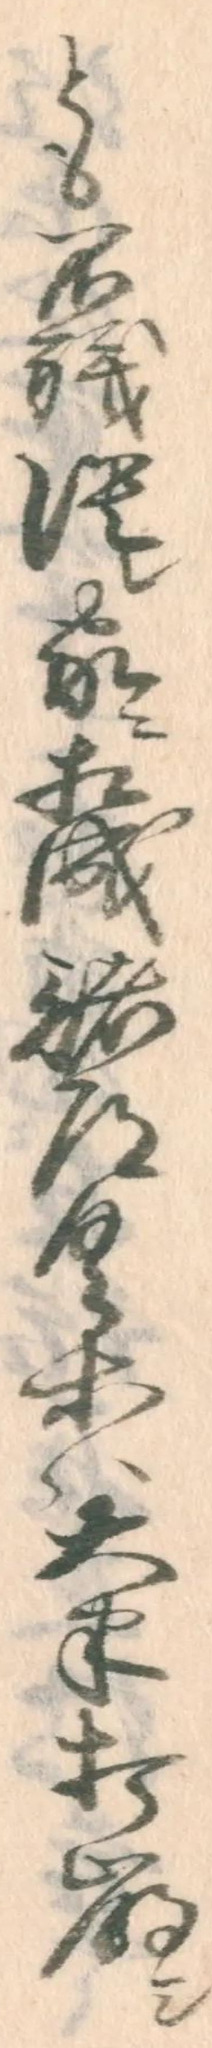とも不残潰レ家ニ相成諸道具等ハ大半打崩シ
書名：地震災書留 2巻. [1] 内表紙に「地震災書留　安政二卯年　但本所深川御用屋敷地代免除調」とあり
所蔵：国立国会図書館 National Diet Library, JAPAN
